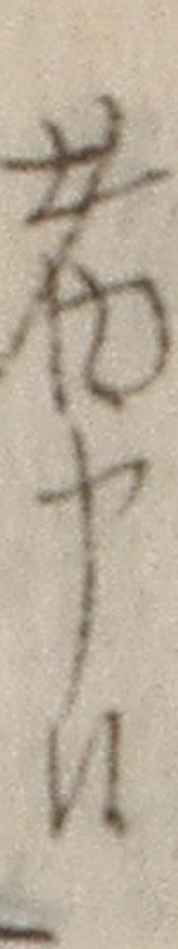者申候
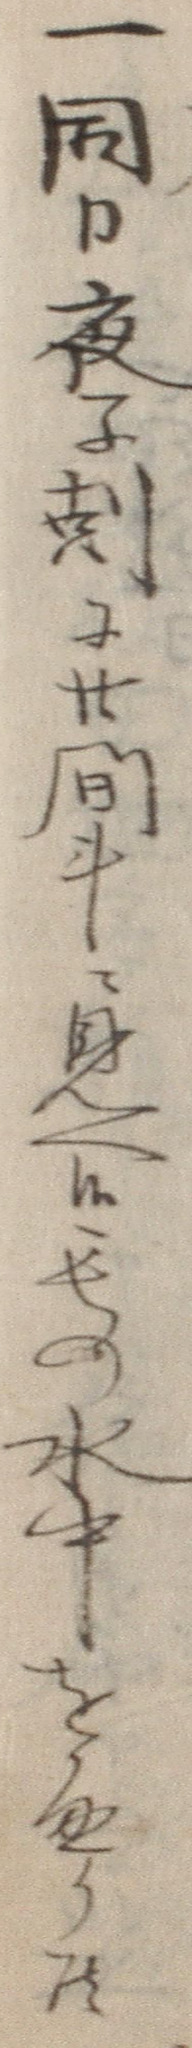一同日夜子刻に廿間斗ニ見へ候もの水中を通り候
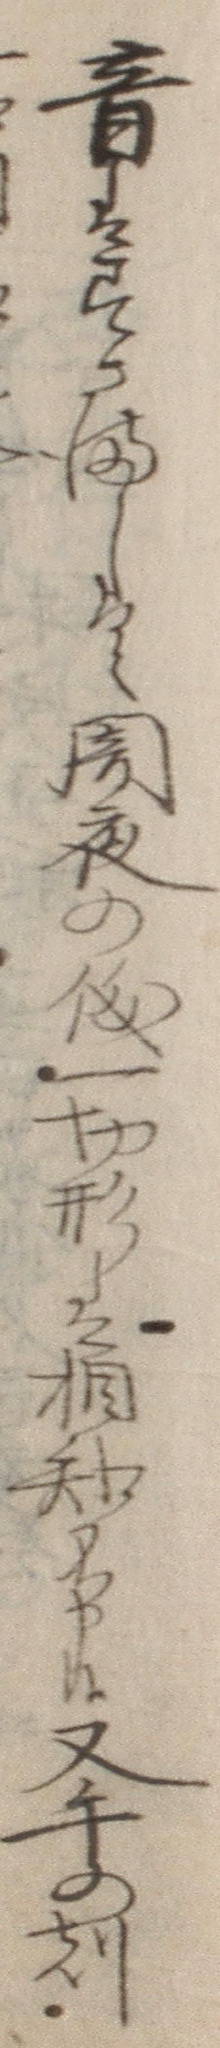音はすさまし旨候闇夜の儀一切形は相知不申候又午の刻
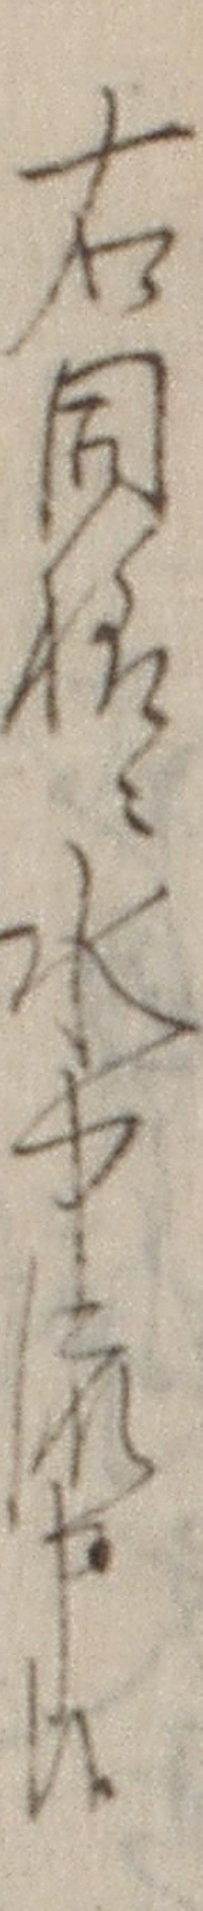右同様ニ水中流申候
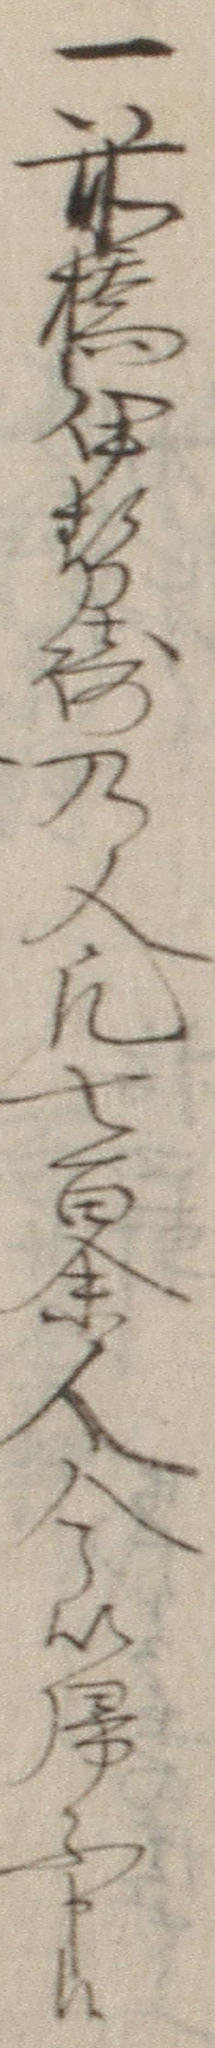一前橋伊勢崎乃人凡七百余人今以帰不申候
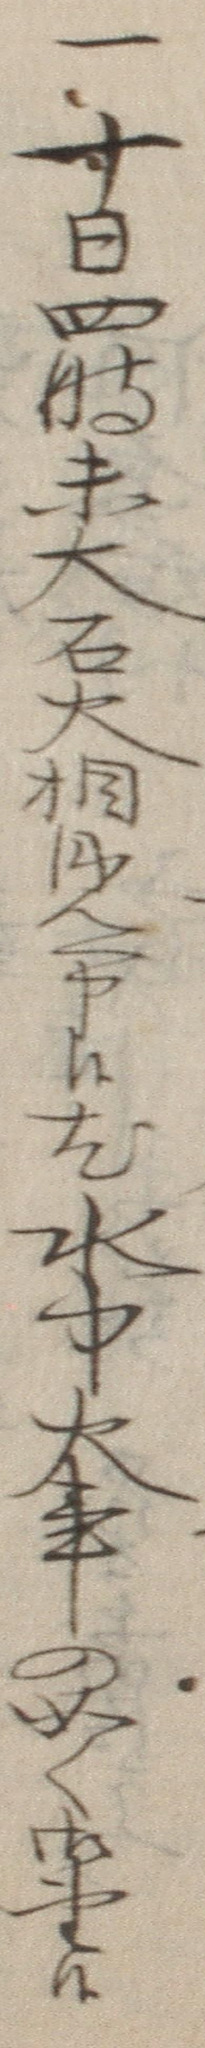一廿日四時未大石火相見へ申候尤水中火事の如く御座候
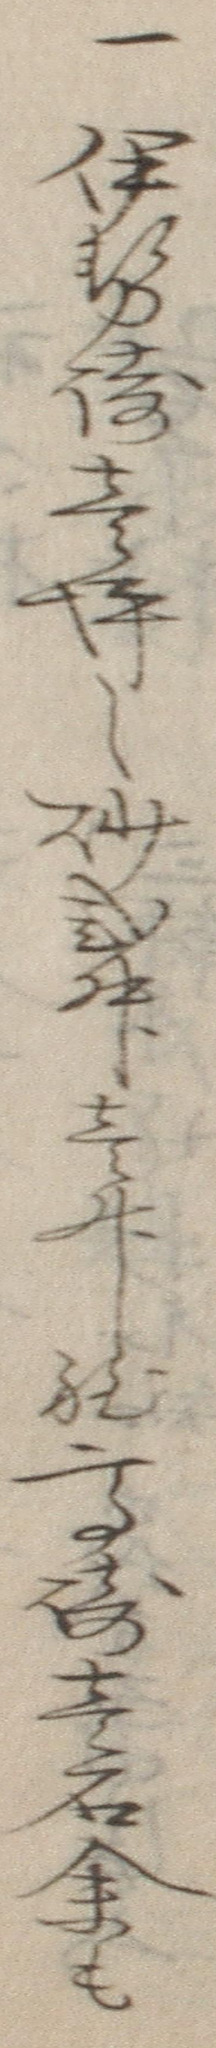一伊勢崎壱坪之砂弐升壱升程高崎壱石余も
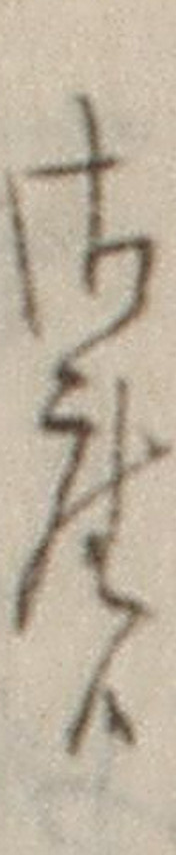御座候
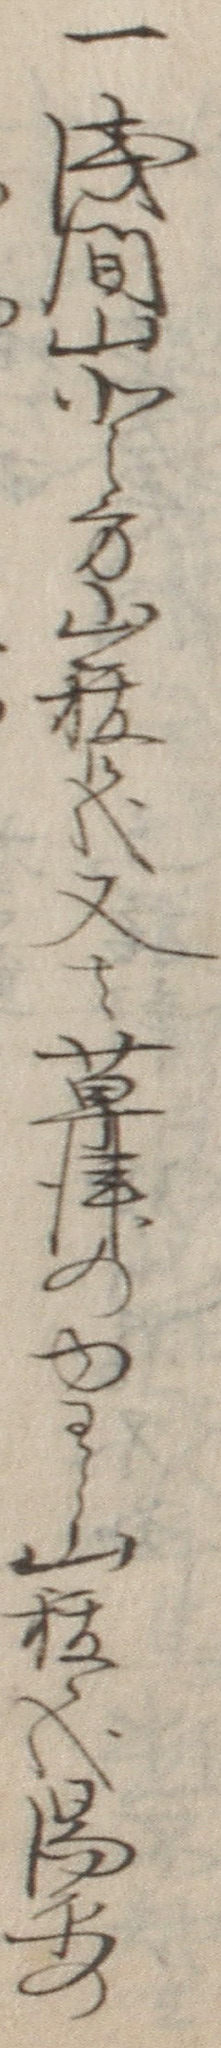一浅間山北之方山抜候哉又は草津のゆり山抜候哉湯番
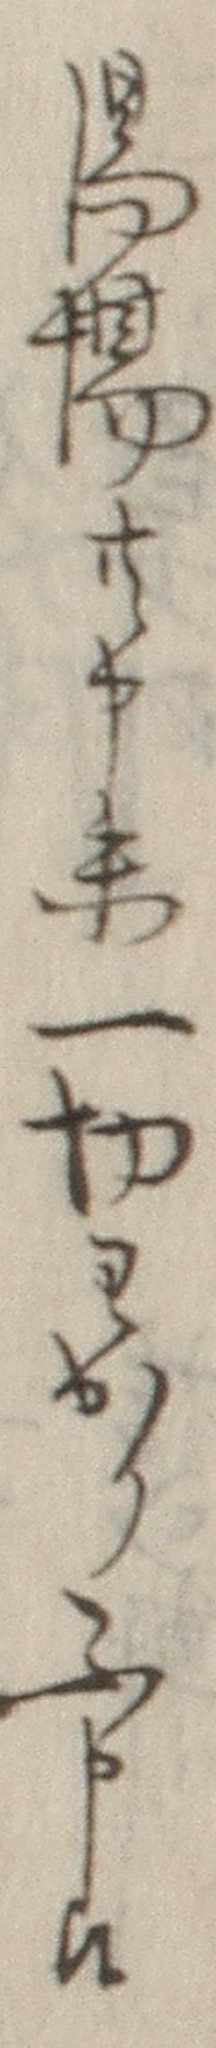湯場共申参一切わかり不申候

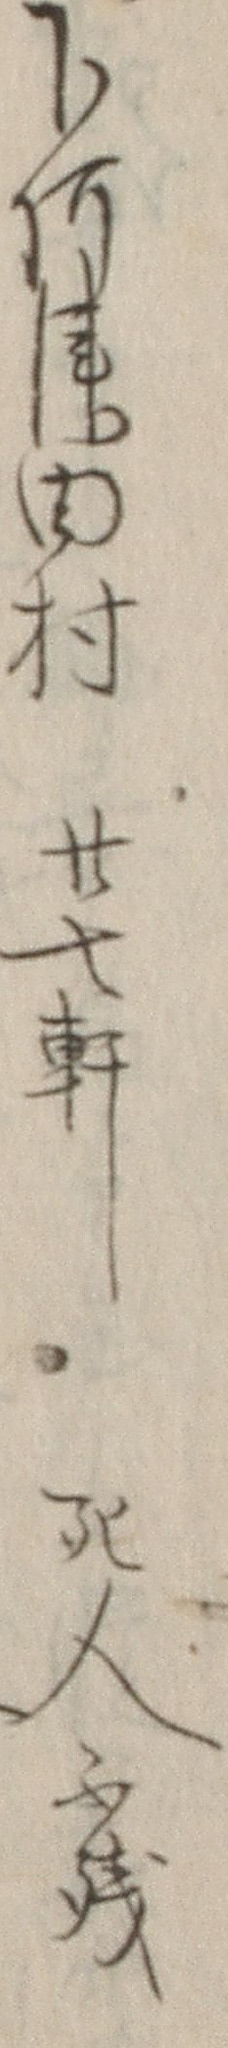下河津田村廿七軒死人残
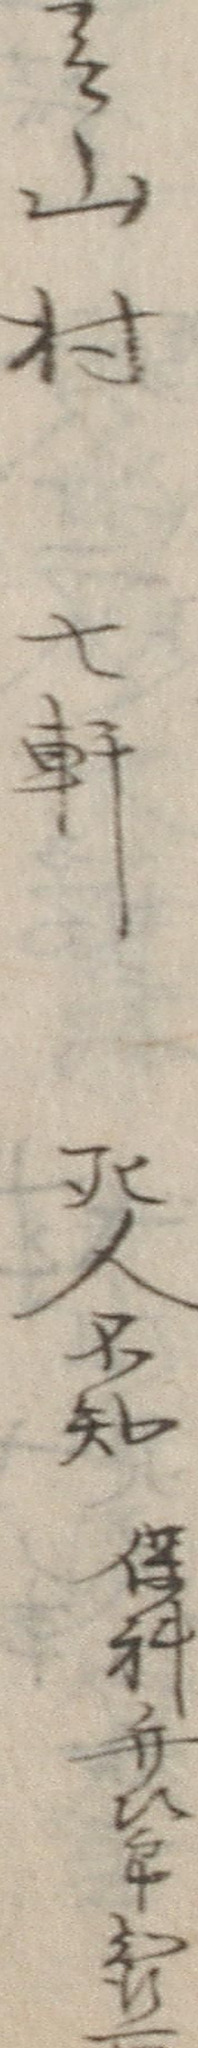青山村七軒死人不知保科弁次郎知行所
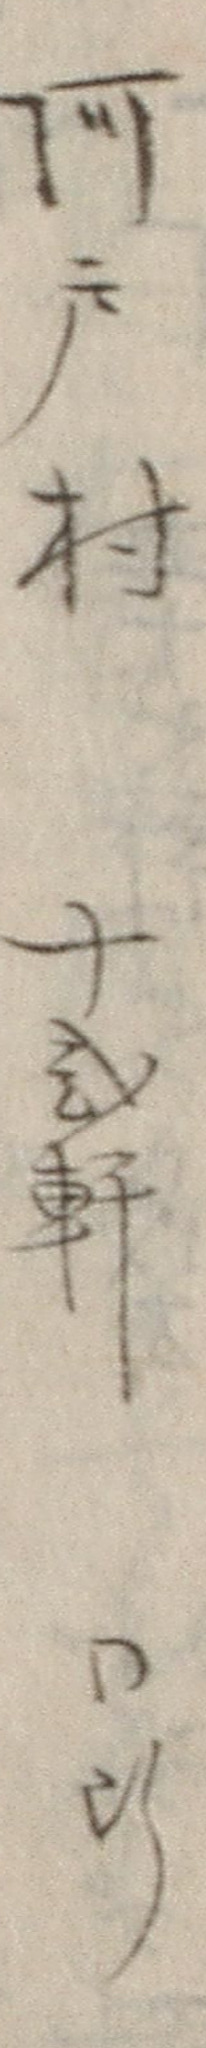河戸村十弐軒同断
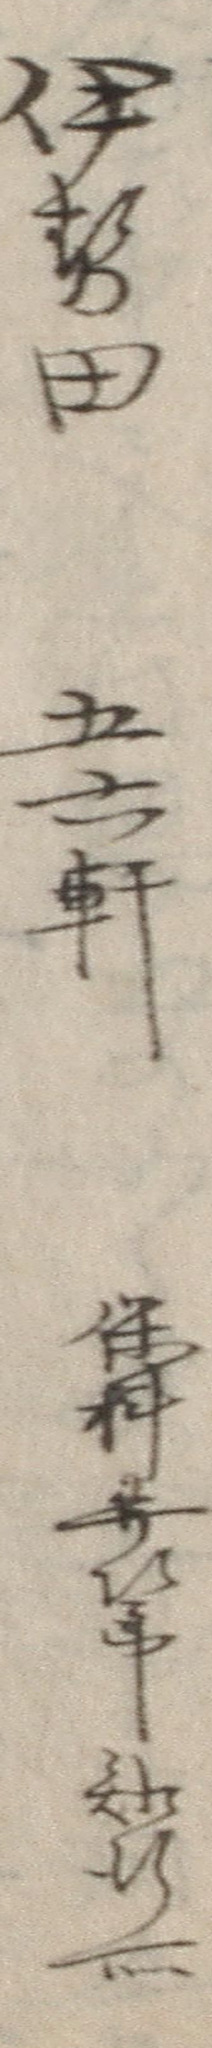伊勢田五六軒保科弁治郎知行所
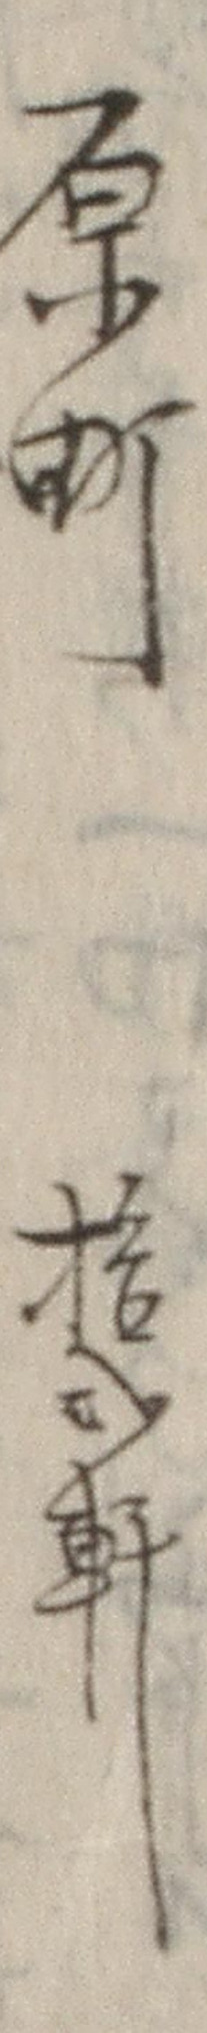原町拾弐軒
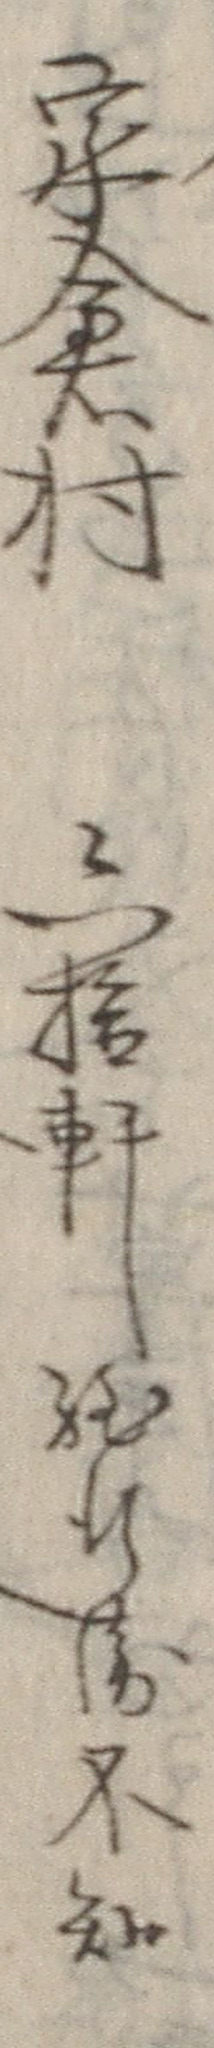家倉村六拾軒程行衛不知
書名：[諸国災害記録]
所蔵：東京大学地震研究所図書室 Earthquake Research Institute Library, The University of Tokyo, JAPAN
